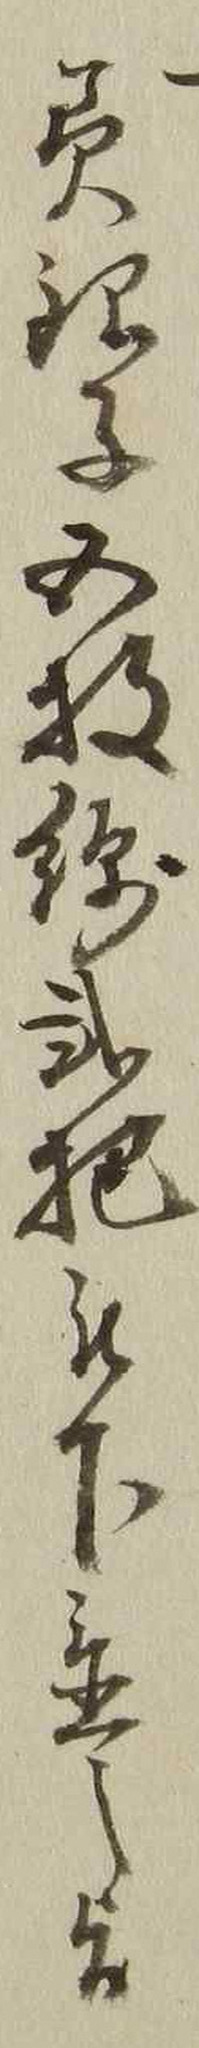美銀子五枚綿弐把被下置之旨
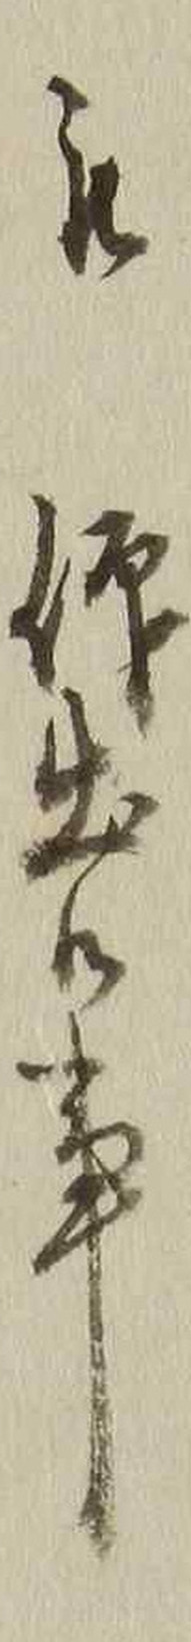被仰出候事
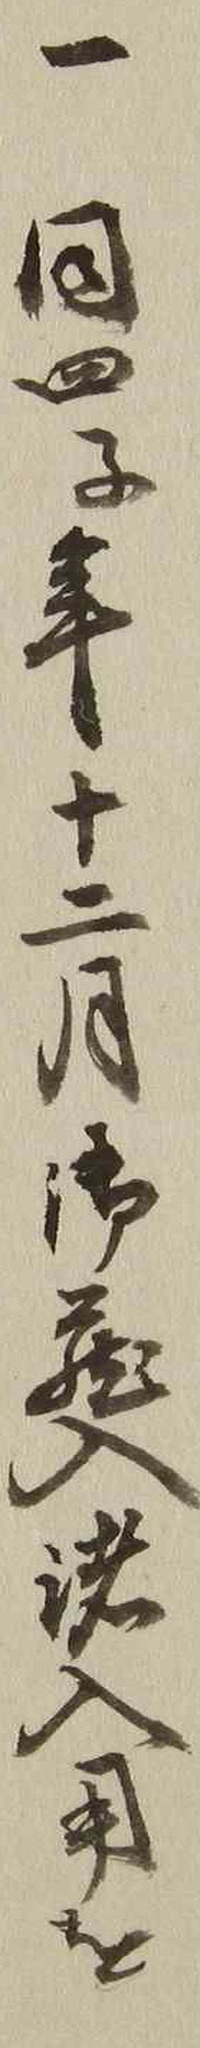一同四子年十二月御蔵入諸入用を
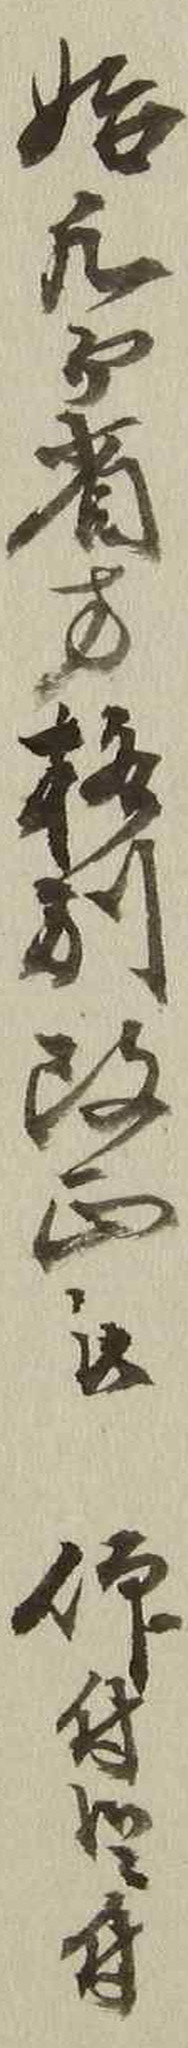始凡御省方格別改正被仰付候ニ付
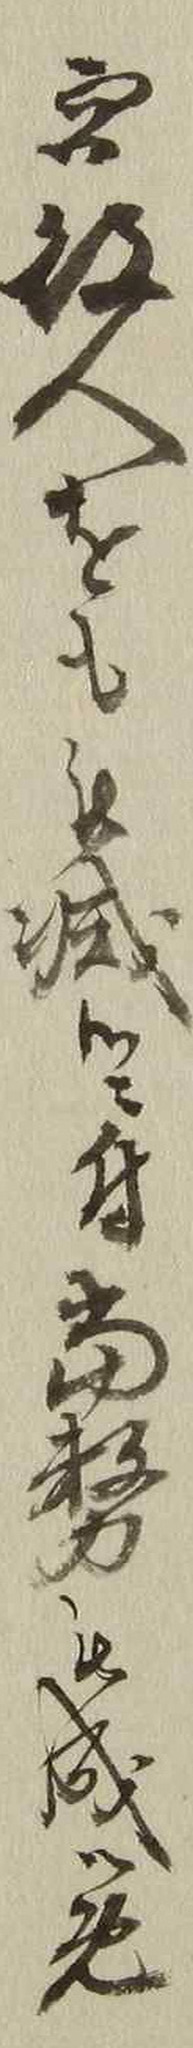而ハ役人をも被減候ニ付当務被成御免
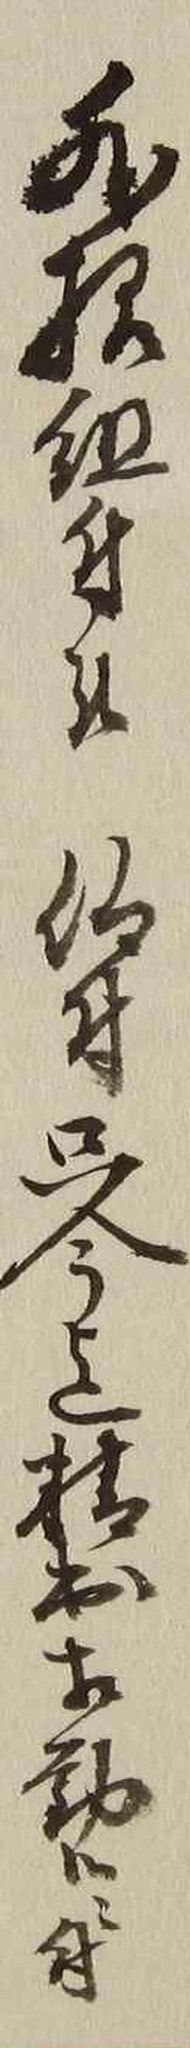外様組付被仰付只今迄精出相勤候ニ付
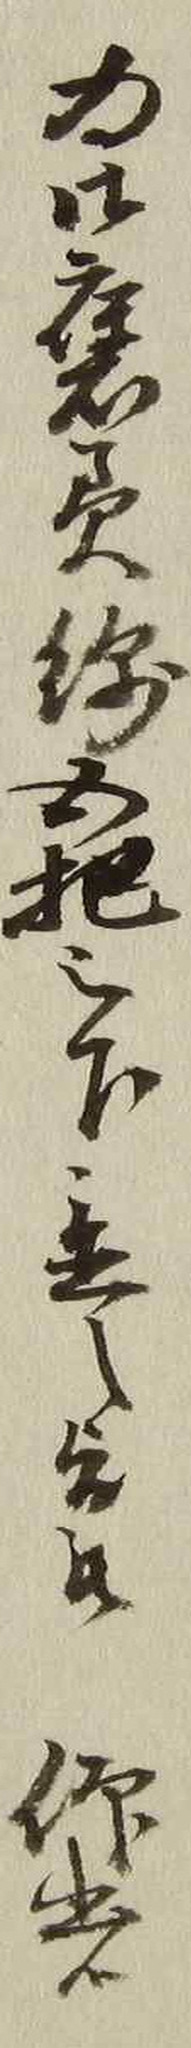為御褒美綿五把被下置之旨被仰出候
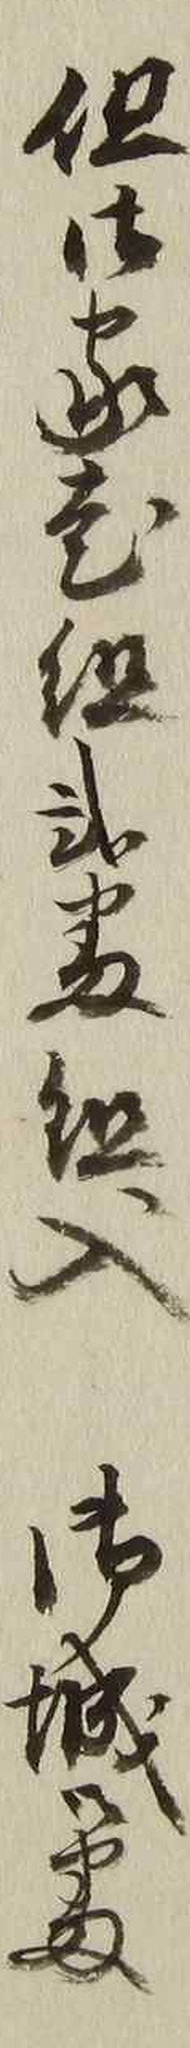但御家老組弐番組へ入御城御番
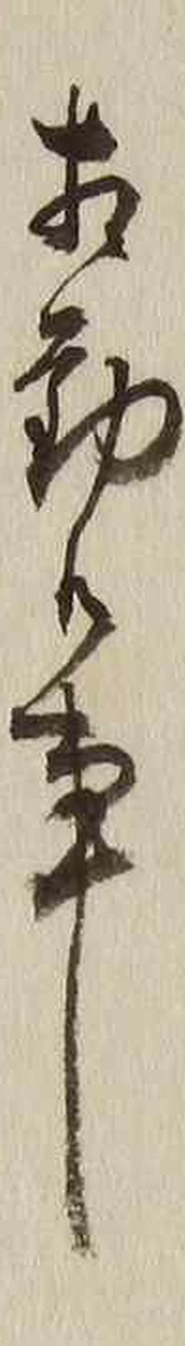相勤候事
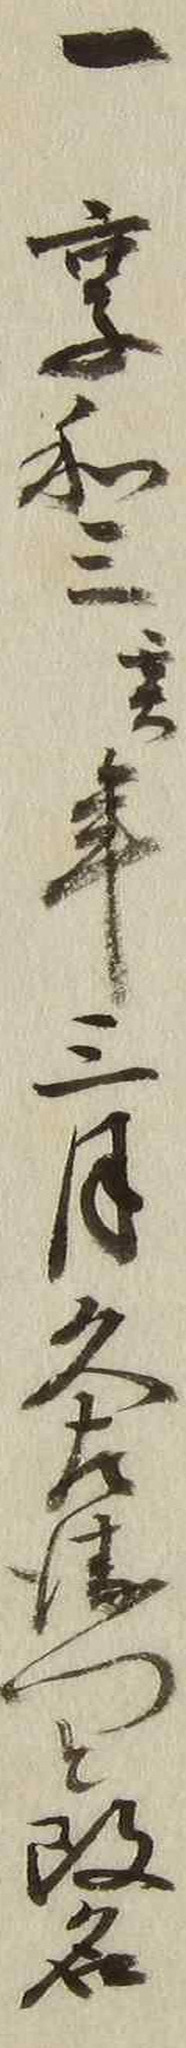一享和三亥年三月久左衛門と改名
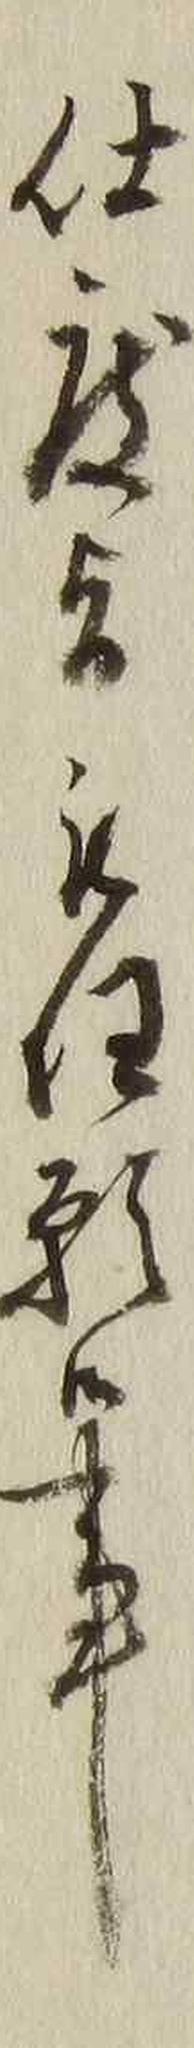仕度旨被任願候事
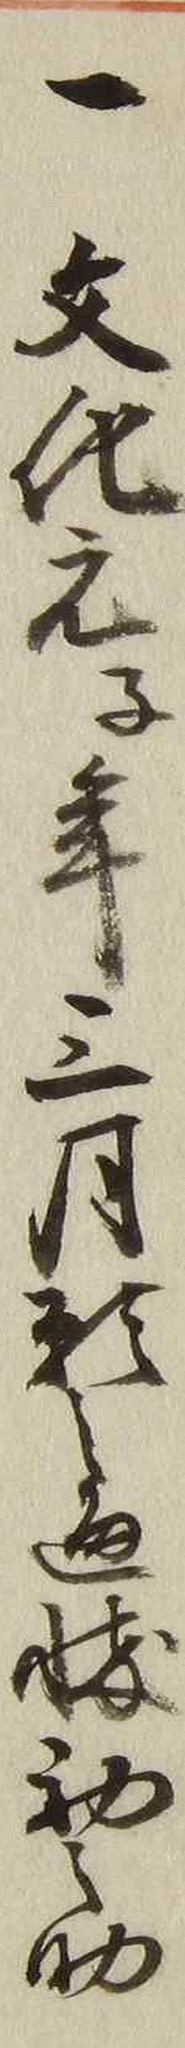一文化元子年三月願之通悴初之助
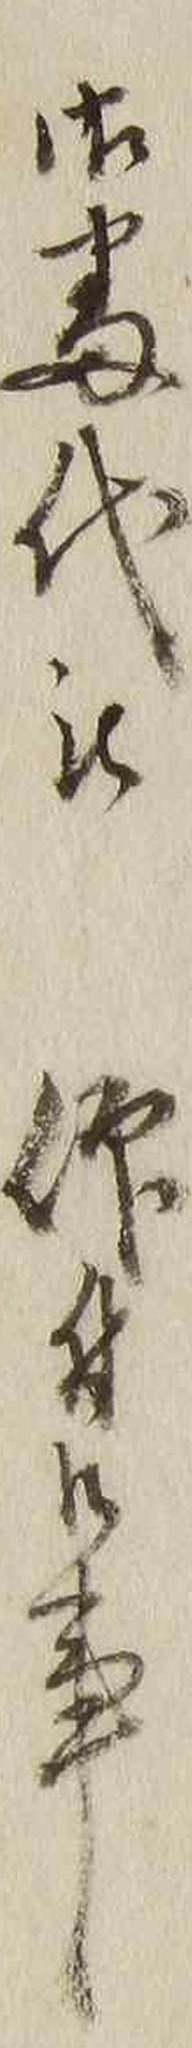御番代被仰付候事
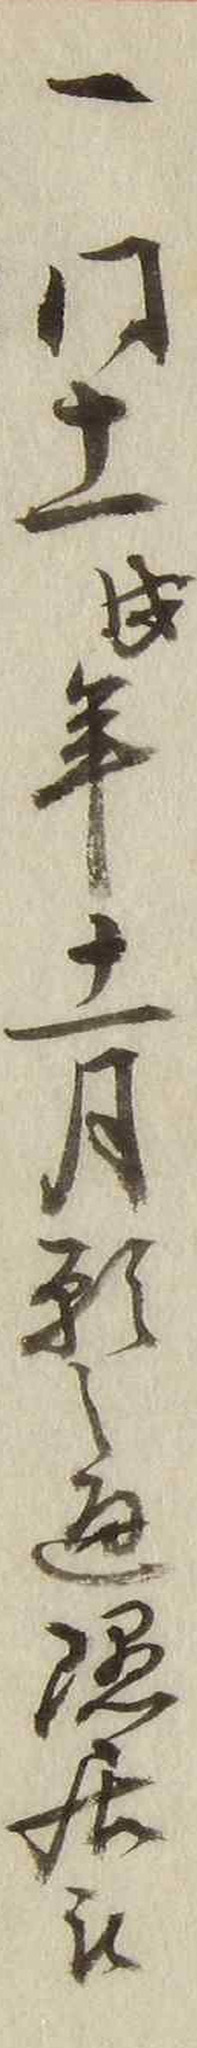一同十一戊年十一月願之通隠居被
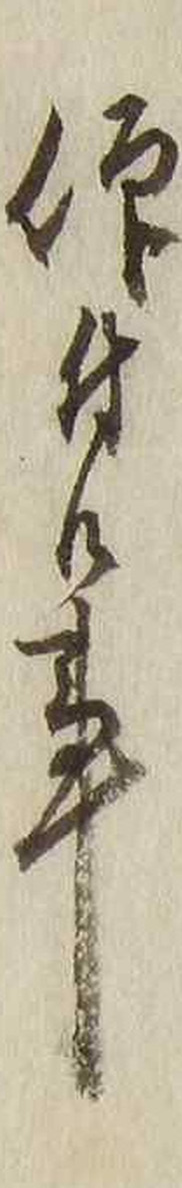仰付候事

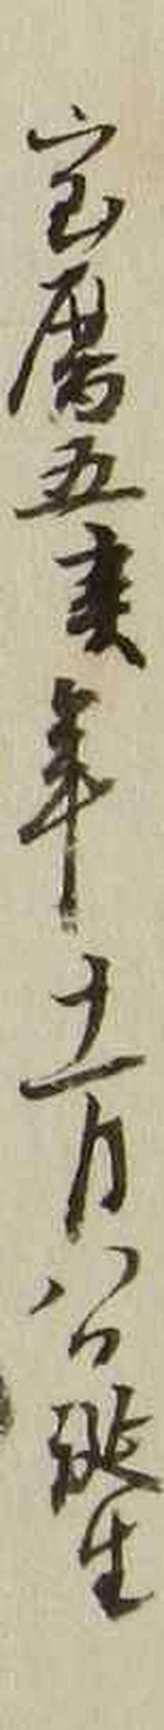宝暦五亥年十一月八日誕生
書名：諸士系譜　巻之23　い之部23
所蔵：会津若松市立会津図書館
